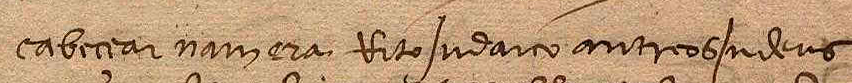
cabecear nam era Rito Judaico antre os Judeus
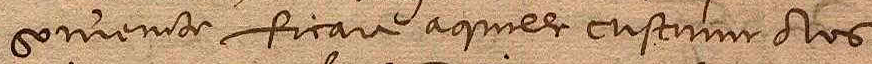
somemte ficara aquelle custume Aos
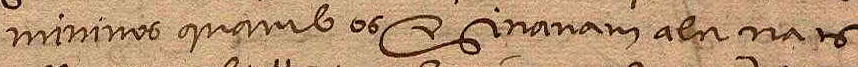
mininos quamdo os ēsinauam a ler na es
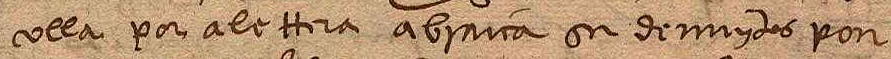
colla por a lettera abraica ser de mujtos pon
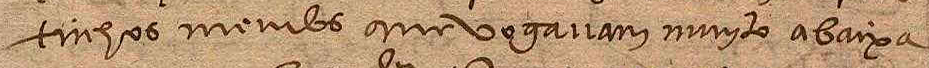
tinhos meudos que vogauam muyto abaixa
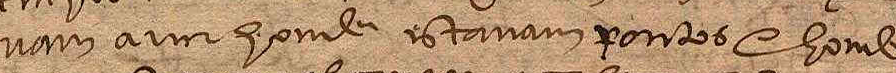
uam a uer honde estauam pontos e honde
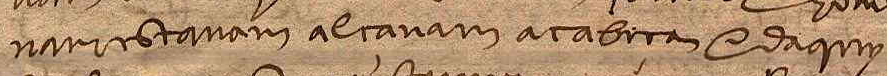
nam estauam alçauam a cabeça e daquy
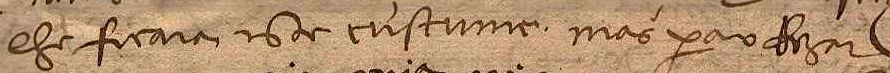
lhe ficara este custume. mas ꝑa o Rezar
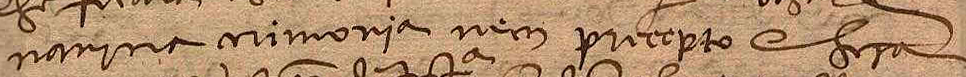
nam era cerimonja nem precepto e hera
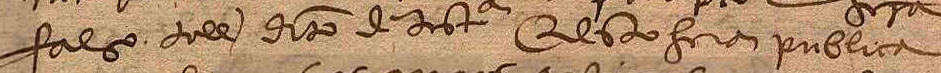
falso tall dito de testa E desto hera publica
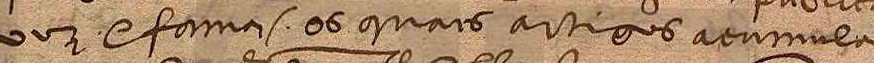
voz e fama /. os quaes artigos acumula
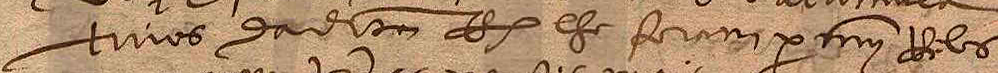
tiuos da dita Rꝭ lhe foram ꝑ mȳ Rdos
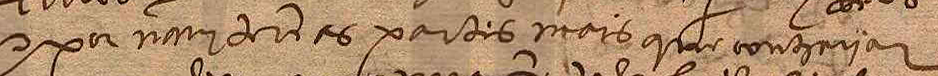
e por nam terē as partes mais que contrarjar
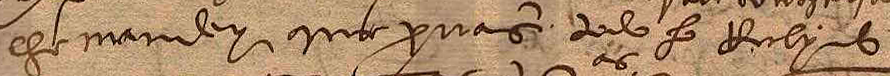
lhe mandey que ꝓuasē todo ho Recebydo
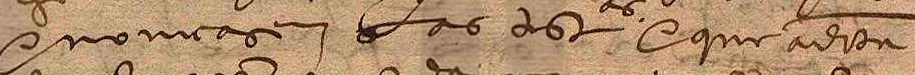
e nomeasem suas testas e que a dita
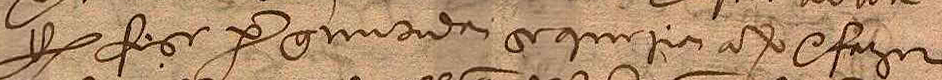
Rꝭ fose ꝑ̄guntada se queria aꝟ e fazer
